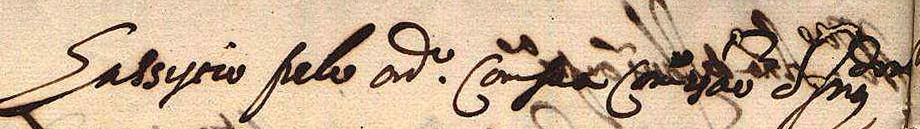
E assystio pelo ordo. Com sua Comisaõ o Jnqdor
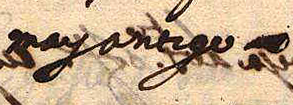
mais antigo -
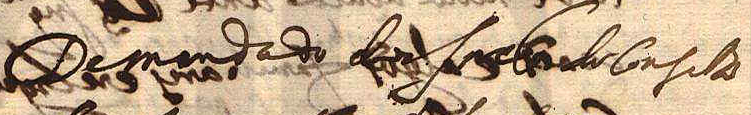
De mandado dos snrs̄ do Conselho
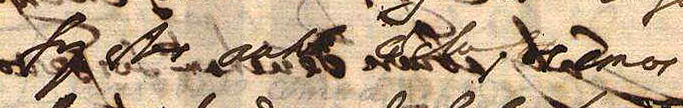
fiz estes autos cōclusos em os
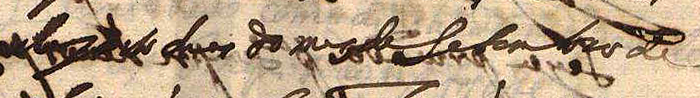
dezoito dias do mes de Setembro de
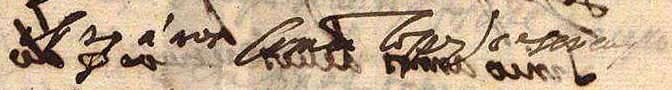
1629 ānos simaõ lopez o escreuj
